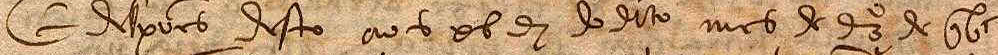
E despoes desto aos xb dj do dito mes de dzo de j̄bc
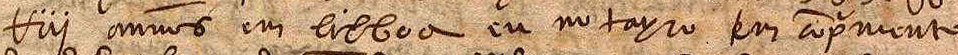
Riij annos em lixboa eu notayro em cōpimento
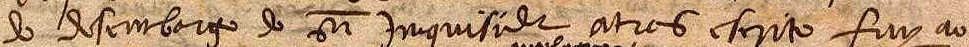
do desembargo do s̄or Jmquisidor atras escrito fuy ao
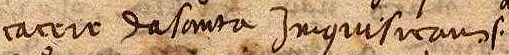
cacere da santa Jmquisiçam .s.
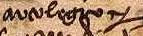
ao colegio cꝭ
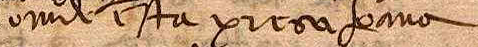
omde esta presa Joana
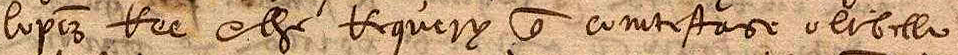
lopez Ree e lhe Requery q̄ comtestase o libello
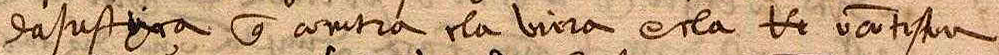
da Justyça q̄ comtra ela viera e ela Re o cōtestou
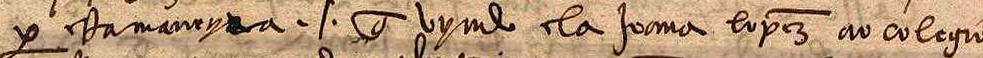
ꝑ esta maneyra .s. q̄ vyndo ela Joana lopez ao colegio
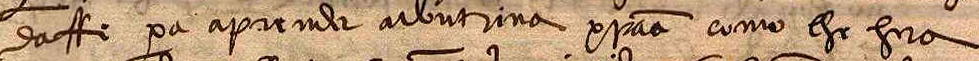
da ffe ꝑa aprender a doutrina xpāa como lhe hera
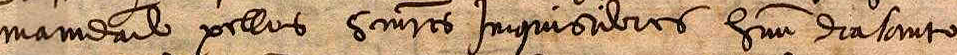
mandado pellos Senōres Jmquisidores huū dia santo
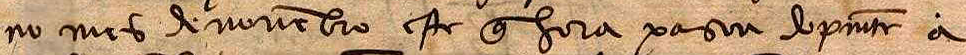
no mes de nouēbro este q̄ hora pasou do pm̄te a
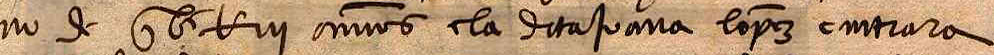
no de j̄bc Riij annos ela dita Joana lopez emtrara
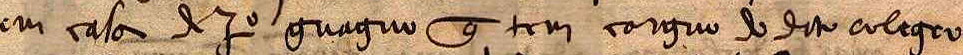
em casa de Jo guaguo q̄ tem carguo do dito colegeo
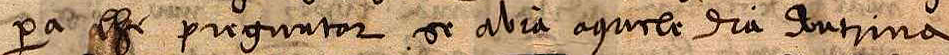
ꝑa lhe preguntar se avia aquele dia doutrina
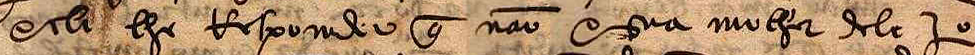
e ele lhe Repomdeo q̄ não e sua molher dele Jo
